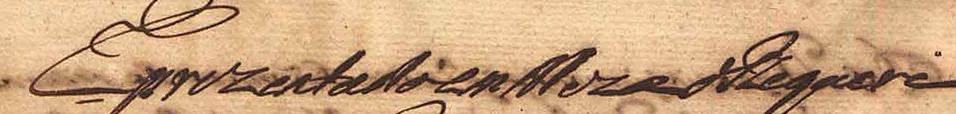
E prezentado em Meza o Requeri
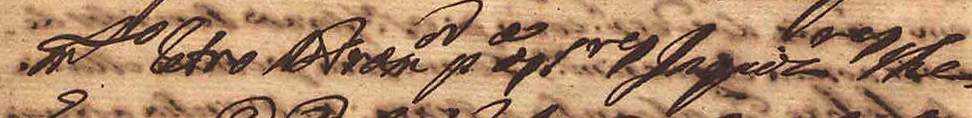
m.to Retro ao Prom.or pa os s.res Jnquizres lhe
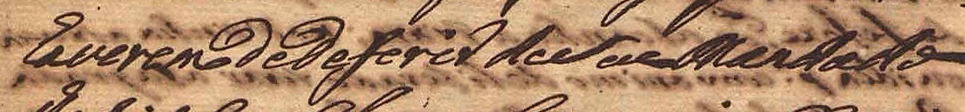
haverem de deferir de Seu Mandado
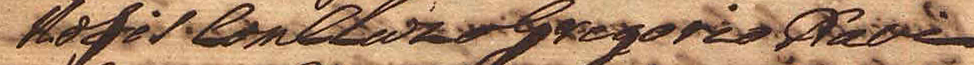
lho fis ComCluzo Gregorio Xavi
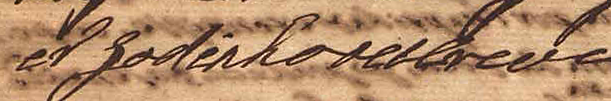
er Godinho o escreui
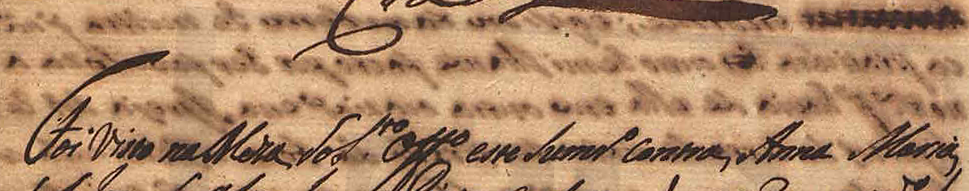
Foi Visto na Meza do S.to off.o este sumr.o contra, Anna Maria
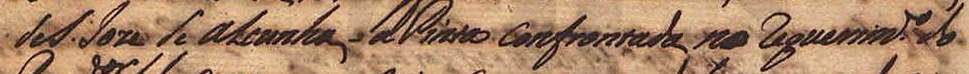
de S. Ioze de alcunha a Pinta confrontada no Requerim.to do
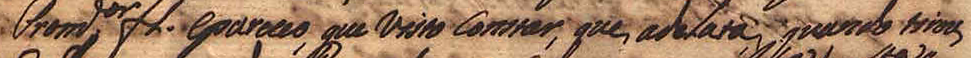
Prom.or fl. e pareceo, que visto constar, que a delata, quando tirou
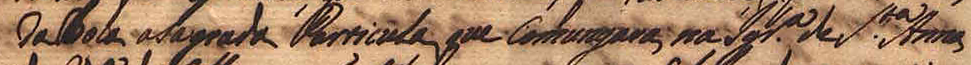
da boca a Sagrada Particula que Comungara, na Igr.a de S.ta Anna,
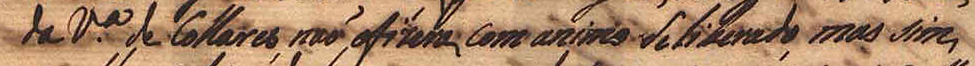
da V.a de Collares, naõ o fizera com animo deliberado, mas sim,
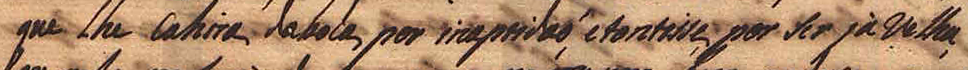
que lhe cahira da boca por inaptidaõ, e tontisse, por ser já velha,
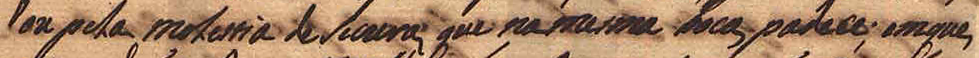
ou pela molestia de secura que na mesma boca padece; em que
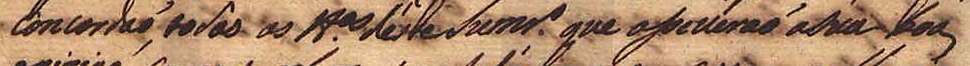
concordaõ, todas as tt.as deste Sumr.o que asseueraõ a sua boa
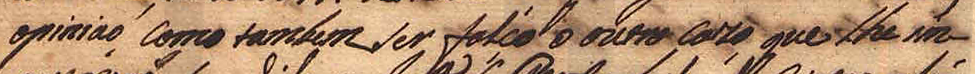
opiniaõ como tambem ser falço o outro cazo, que lhe im
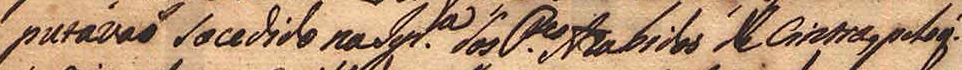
putavaõ socedido na Igr.a dos P.es Arabidos de Cintra, pelo q̄
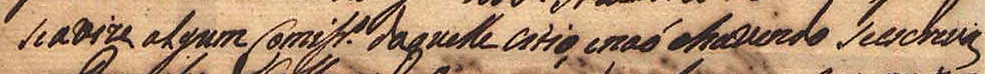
se avize algum Comisr.o daquelle citio, e naõ havendo se escreva
